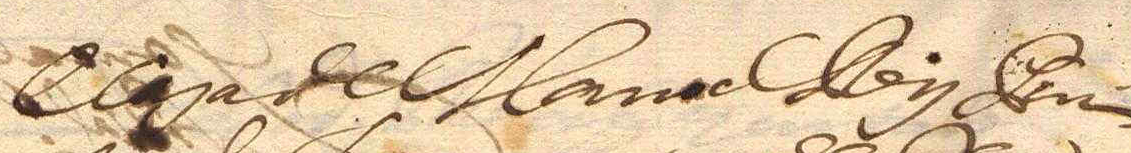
E casa de Manoel Rois Pen
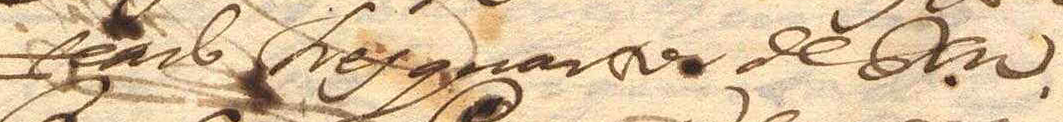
teado tres quartos de x. n.
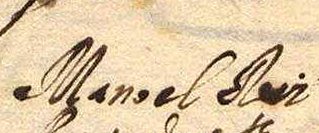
Manoel Roiz̄
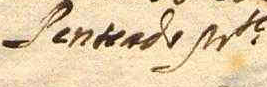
Penteado pr.te
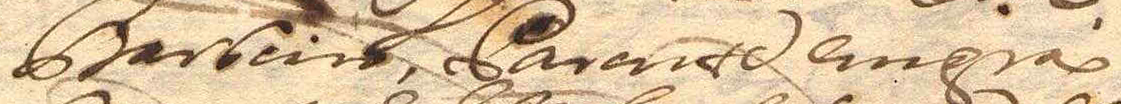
Barbeiro, Parente em grao
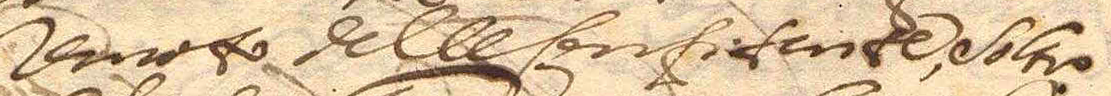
Remoto delle Confitente, soltro
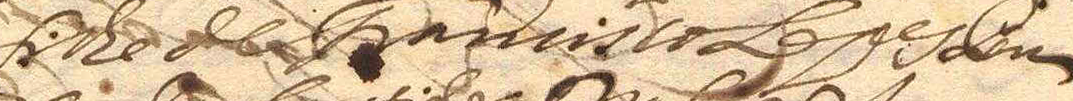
filho de Francisco Lopes Pen
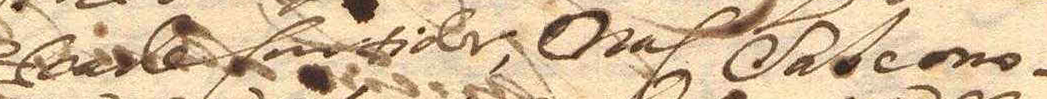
teado Curtidor, naꝭ Sabe o no
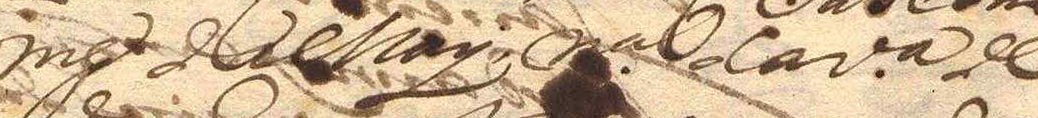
me da May, n.al da v.a de
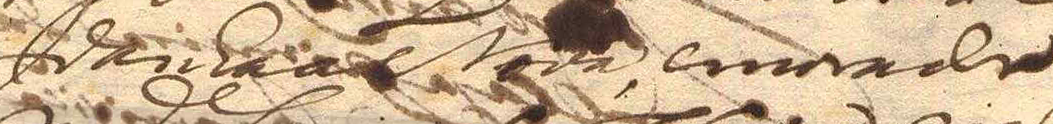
Jdanha a Nova, e morador
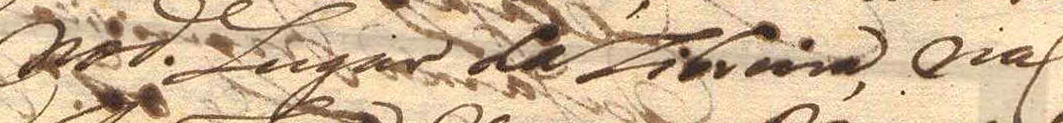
no d.o Lugar da Zibreira, naõ
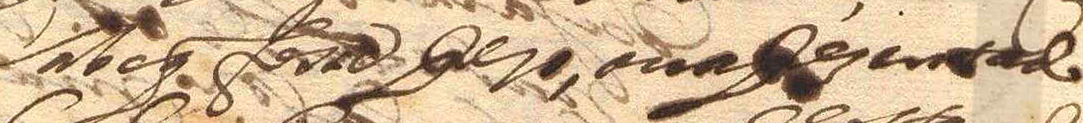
sabe q̄ fosse pRezo, ou apResentado
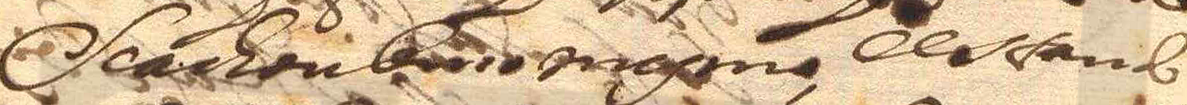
Se achou Com o mesmo, e estando
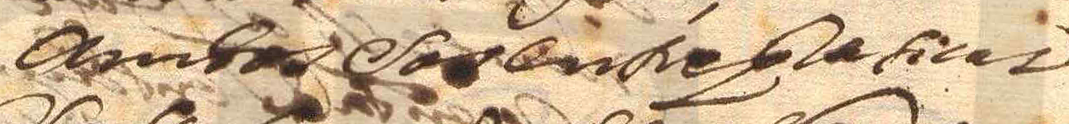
ambos sos entre pRaticas
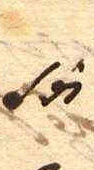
sós
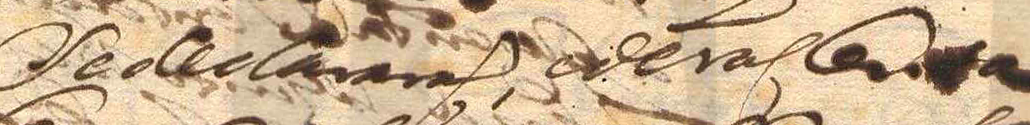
Se declararaꝭ, e deraꝭ Conta
